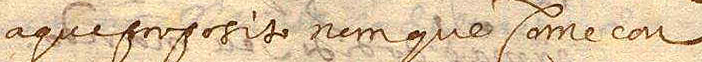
a que proposito nem quē Começou
